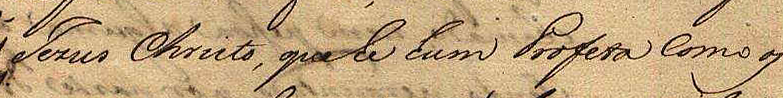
Iezus Christo, que he hum Profeta, como os
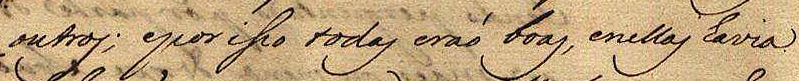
outros; e por isso todas eraõ boas, e nellas havia
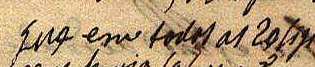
que em todos as Religi
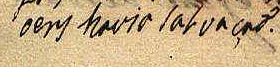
oens havia salvaçaõ.
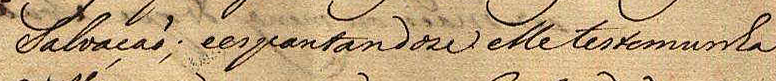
Salvaçaõ; e espantandose elle testemunha
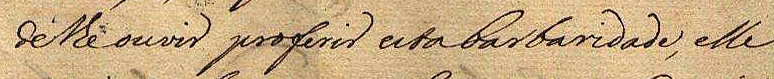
de lhe ouvir proferir esta barbaridade, elle
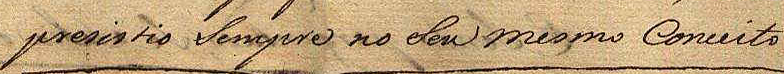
presistio Sempre no Seu mesmo Conceito
